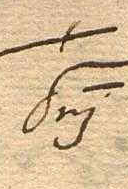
dnj̄
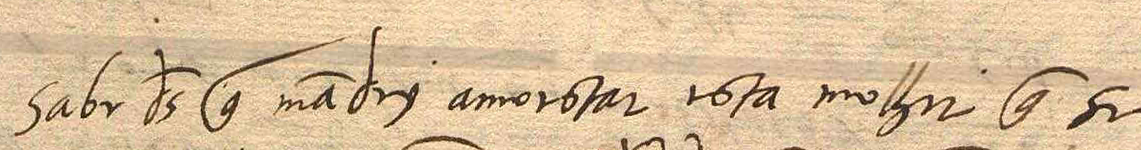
Sabe ds̄ q̄ mādey amoestar esta molher q̄ se
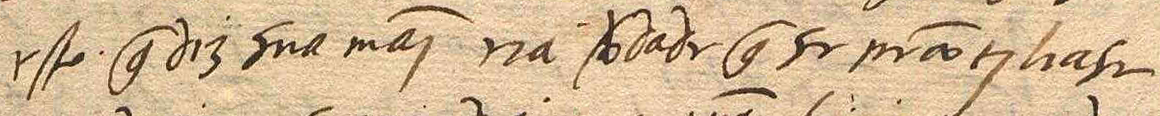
esto q̄ diz sua mãj era ꝟdade q̄ se recōtjliase
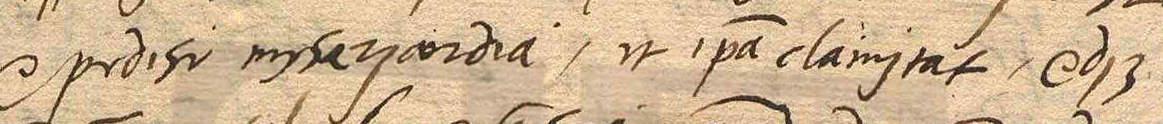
e pedise myserjcordia / et ip̄a clamjtat / e djz
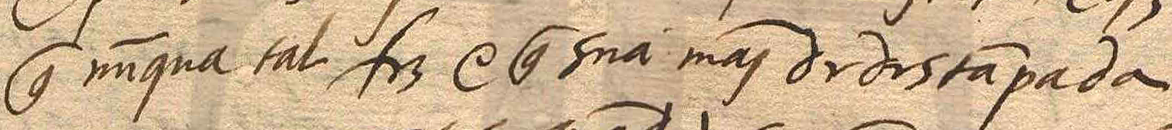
q̄ nūqua tal fez e q̄ sua mãj de destāpada
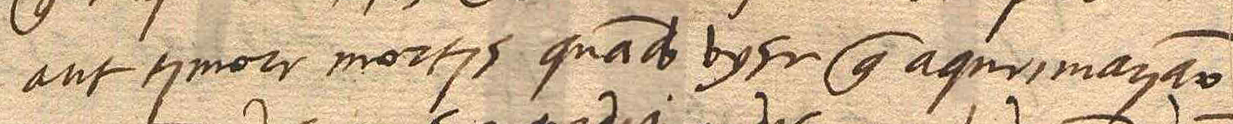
aut tjmore mortjs quādo vyse q̄ a queimarjão
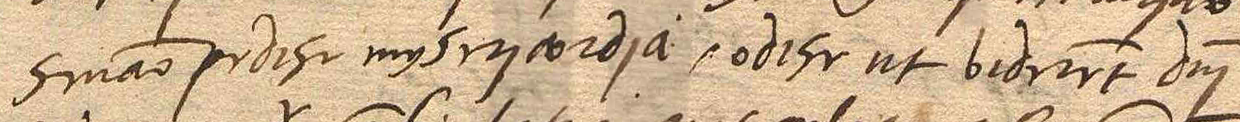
se não pedise myserjcordja / o dise ut viderēt dnj̄
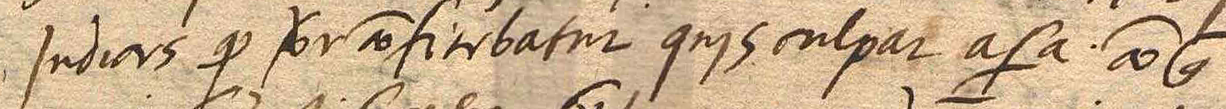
Judices ꝙ ꝟe c̄ofitebatur qujs culpar a fa c̄o q̄
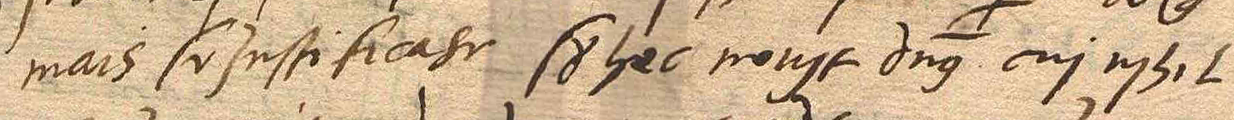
mais se Justificase sd' hoc moujt dnꝯ̄ cuj njhil
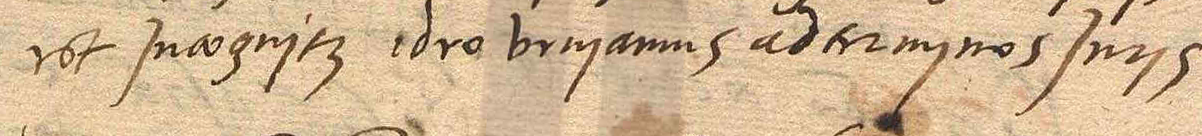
est Jncognjtꝫ ideo venjamus ad termjnos Jurjs
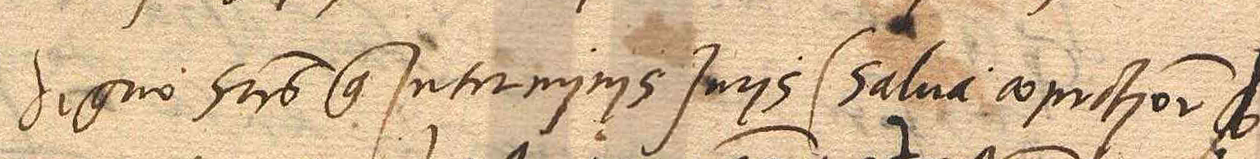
diguo srēs q̄ Jn termjnjs Jurjs (salua corectjōe
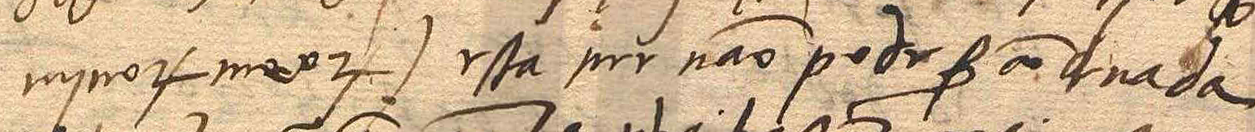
mjnoꝵ meoꝵ) esta ree não pode ꞩ c̄odenada
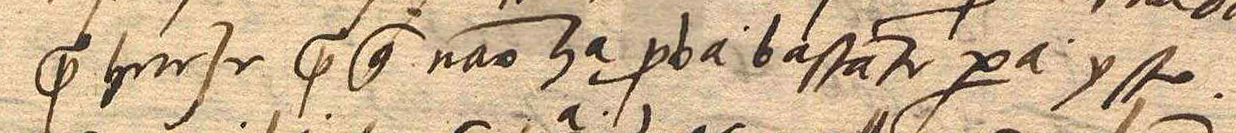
p̄o hereJe p̄oq̄ não ha ꝓva bastāte ꝑa ysto
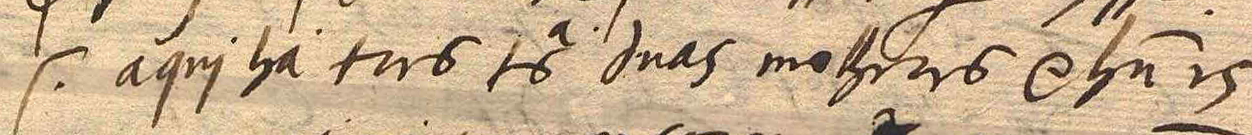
s. aquj ha tres tas duas molheres e hū es
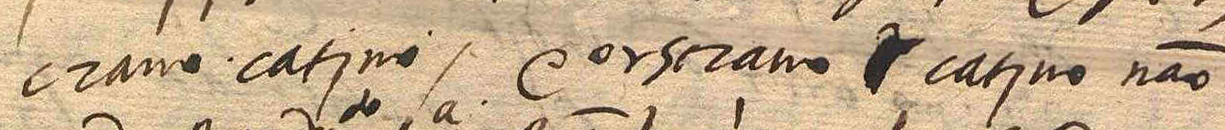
crauo catjuo / e o escrauo catjuo não
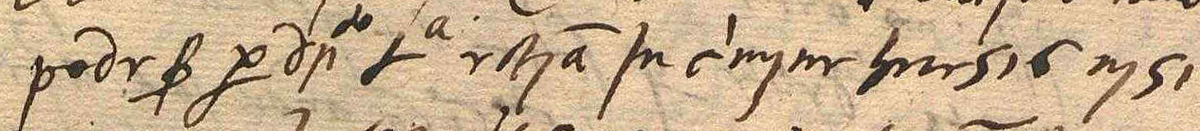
pode ꞩ ꝑ drto ta ectjā Jn cimjne heresis njsi
